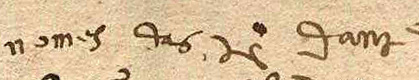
nomes das ts danto
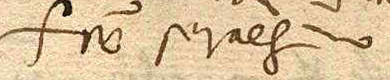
frrz̄ seralhro
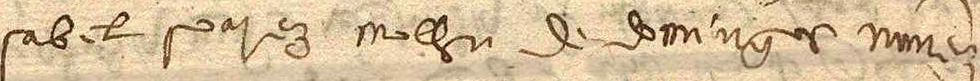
item Jsabel soarez molher de domingos nunez
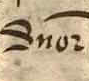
Sn̄or
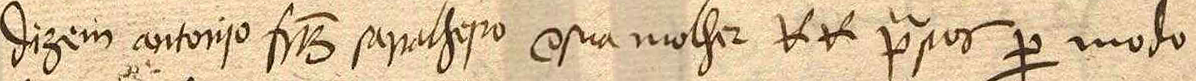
dizem antonjo frz̄z saralhejro e sua molher RR p̄sos ꝑ modo
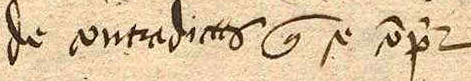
de contradictas q̄ se c̄op̄r
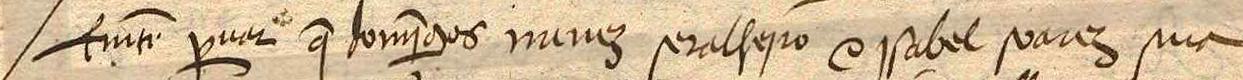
Emt̄i. ꝓuar q̄ domj̄gos nunez seralhejro e jsabel soarez sua
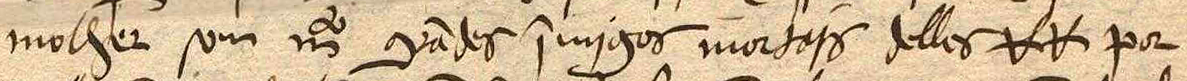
molher som mto grādes j̄mjgos mortajs delles RR por
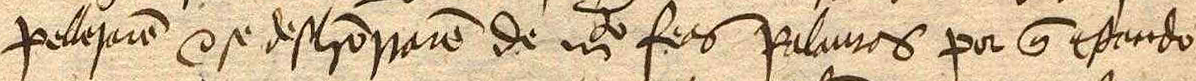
pellejar̄e e se deshōrrar̄e de mto feas palauras por q̄ Estando
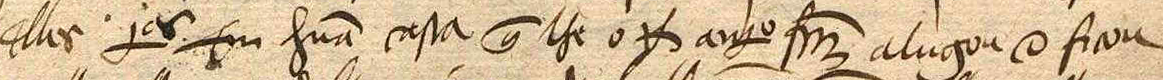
Elles tas Em hūa cassa q̄ lhe o R anto fr̄rz alugou e ficou
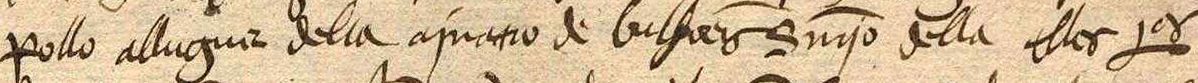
pollo alluguer della a jnatio de bulhoẽs Sn̄rjo della Elles tas
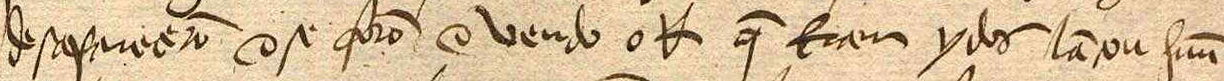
desaparecer̄o e se for̄o e vendo o R q̄ Eram ydos lācou huū
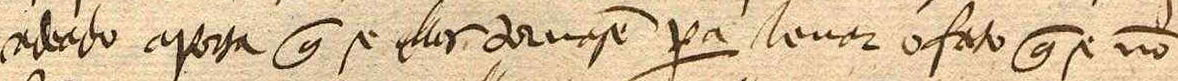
cadeado a porta q̄ se Elles tornas̄e ꝑa leuar o fato q̄ se n̄o
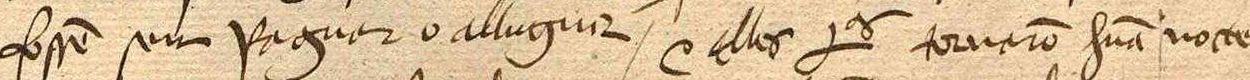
foss̄e sem paguar o alluguer / e Elles tas tornar̄o hūa nocte
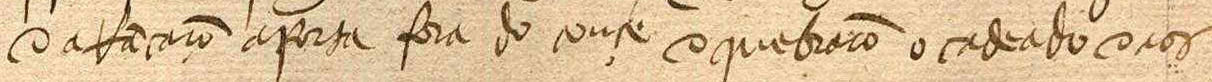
e aRācar̄o a porta fora do couee e quebrar̄o o cadeado e aos
